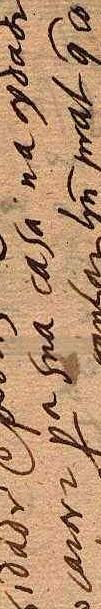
o carcer ꝑa sua casa na cydade
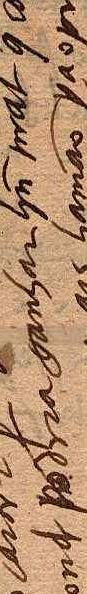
onde podera ganhar hū real q̄ co
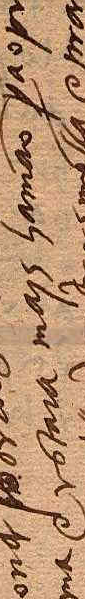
ma e estara majs ha mão ꝑa o pe
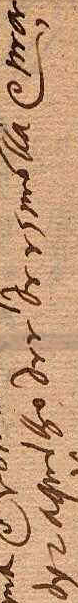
dyr a quē lho dee de esmolla e rece
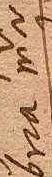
bera mrce
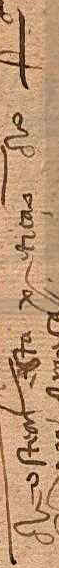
Acostese esta petiçaõ Ao fto
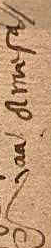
e vaa A mesa /
